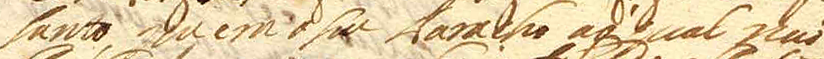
Santo, que em o seu Paracho ao qual naõ
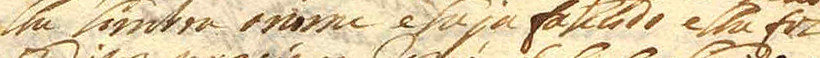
lhe lembra o nome e haja falecido e lhe fez
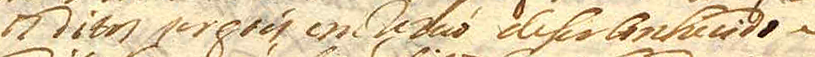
os ditos pergoes em Rezaõ de ser conhecido e
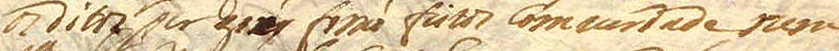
os ditos pergoes foraõ feitos com uerdade nem
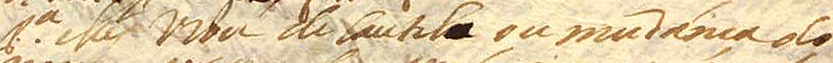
p.a elle uzou de cautela ou mudança do
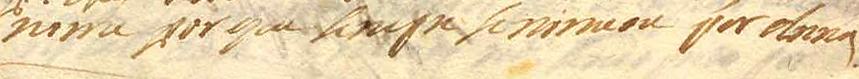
nome porque sempre se nomeou por Anna
